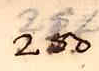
280
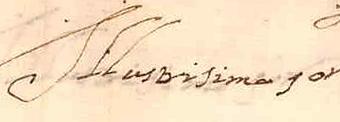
Illustisimo sor
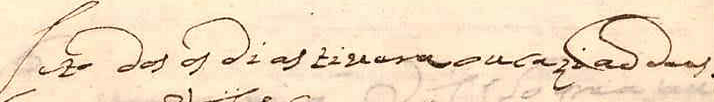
Se todos os dias tiuera oucaziaõ de es
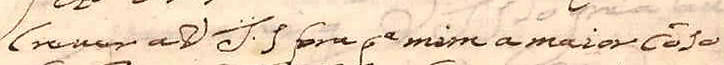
Creuer a V. J. S fora pa mim a maior cōso
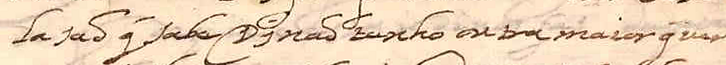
Lasaõ q̄ sabe Ds̄ naõ tenho outra maior q̄ uer
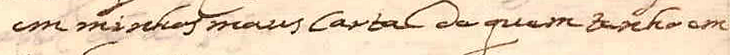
em minhas maus Carta de quem tenho em
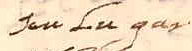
seu Lugar
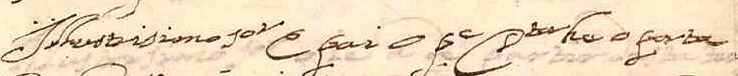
Illustrisimo sor E pai O p.e Dtor he o porta
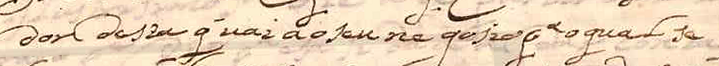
dor desta q̄ uai ao seu negosio pa o qual se
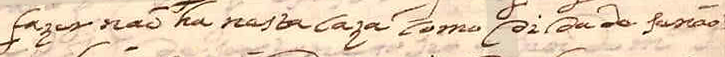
fazer naõ ha nesta caza comodidade senaõ
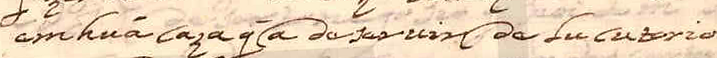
em huā caza q̄ a de seruir de Lucutorio
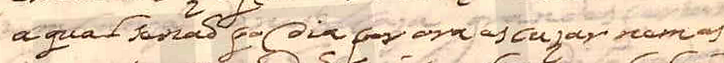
a qual se naõ podia por ora escuzar nem as
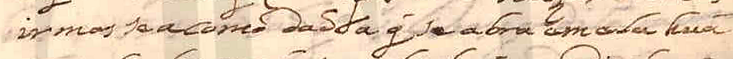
irmas se acomodaõ a q̄ se abra em ela huā
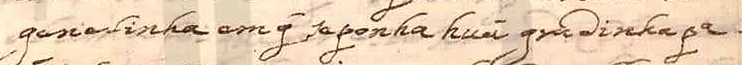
genelinha em q̄ se ponha huā gradinha pa
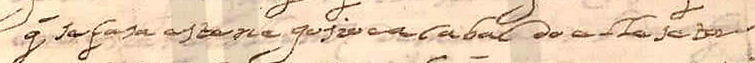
q̄ se fasa este negosio e acabado elle se tor
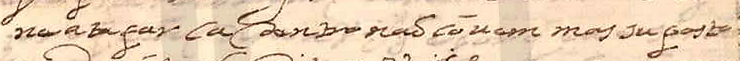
na a tapar ca dentro naõ cōuem mas suposto
